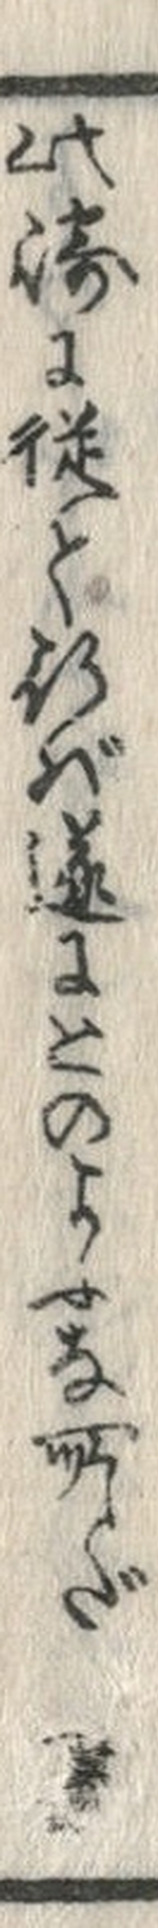此崎に従て行ば遂にとのよふな所だ
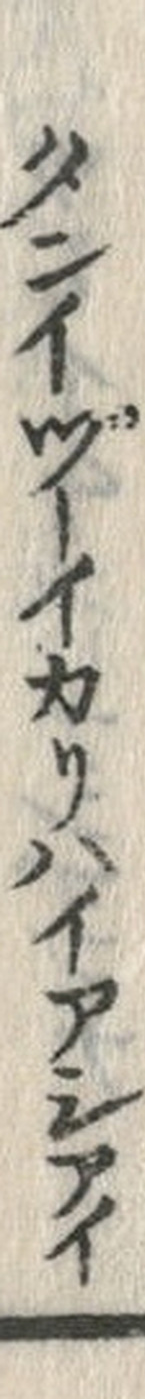タンイツ゚ーイカリハイアシアイ
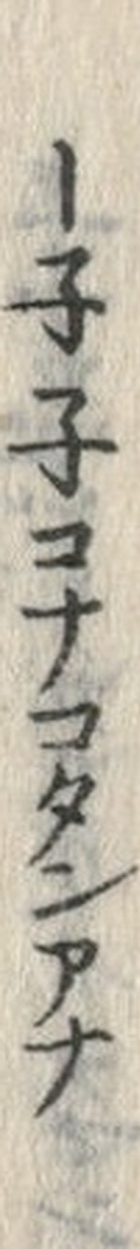ーネネコナコタンアナ
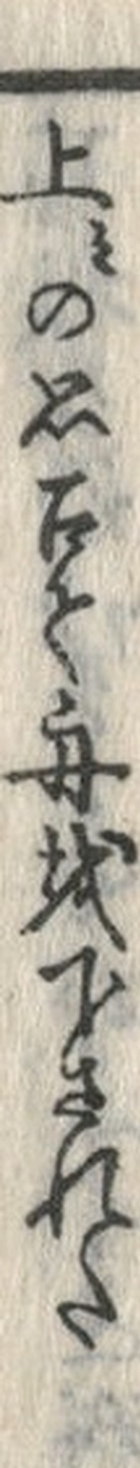上みの思召て舟を下された
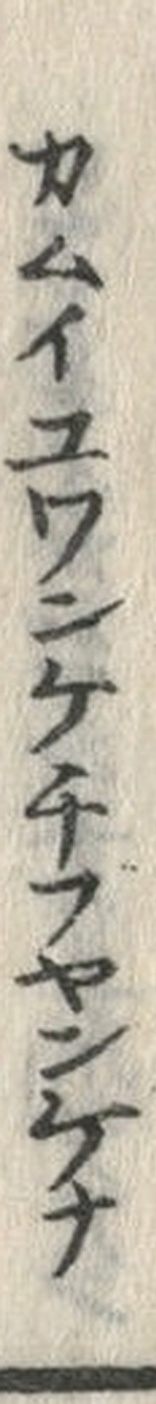カムイユワンケチブヤンゲナ
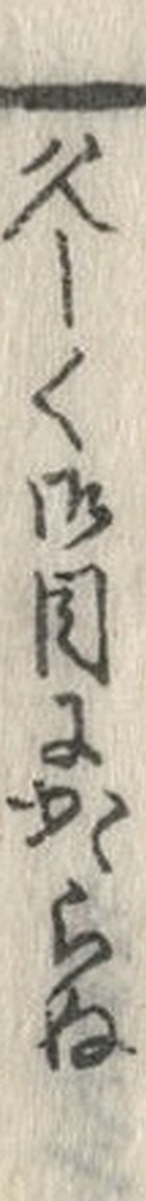久しく御目にかゝらぬ
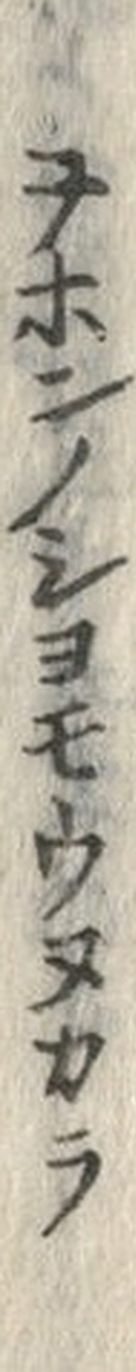ヲホンノシヨモウヌカラ

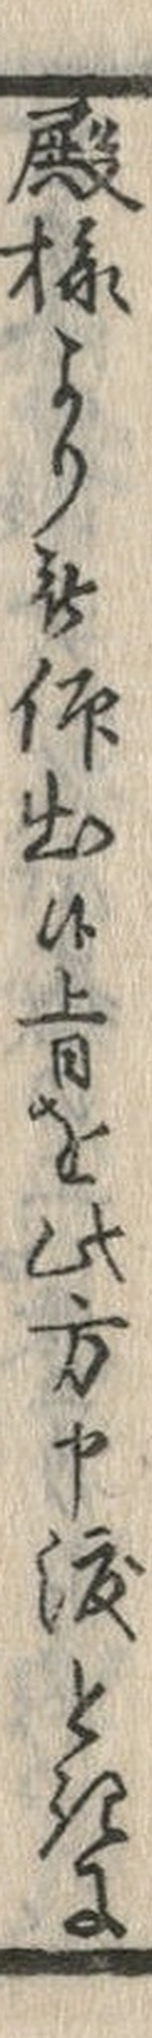殿様より被仰出候旨を此方申渡ときに
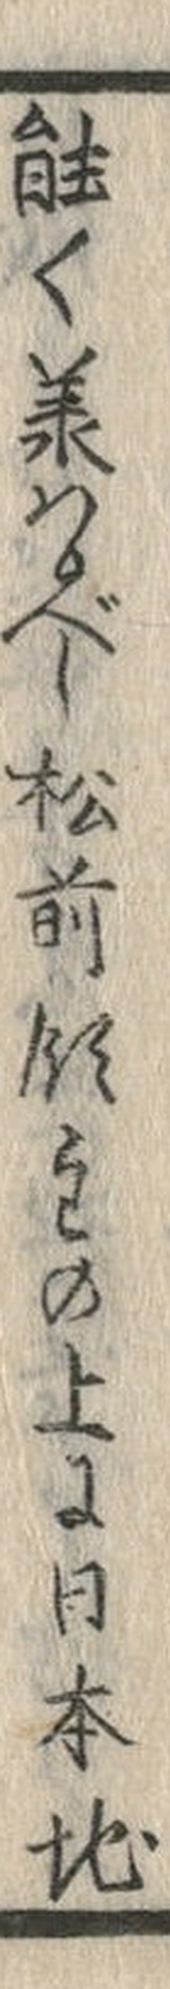能く承はるべし松前領主の上に日本地
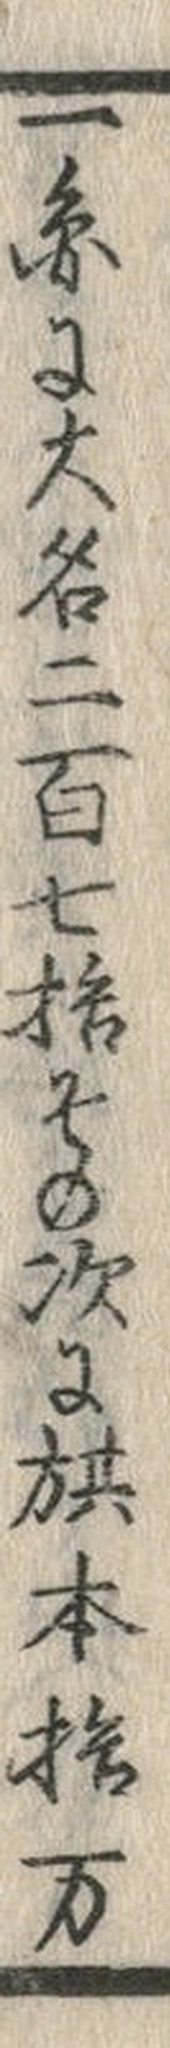一圓に大名二百七拾その次に旗本拾万
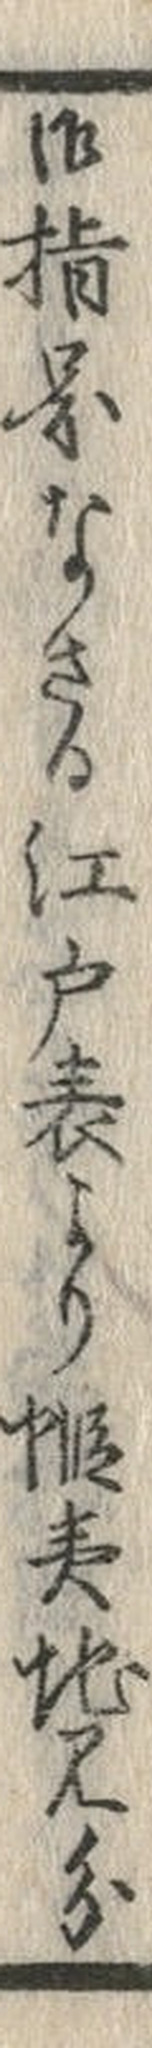御指図なさる江戸表より蝦夷地見分
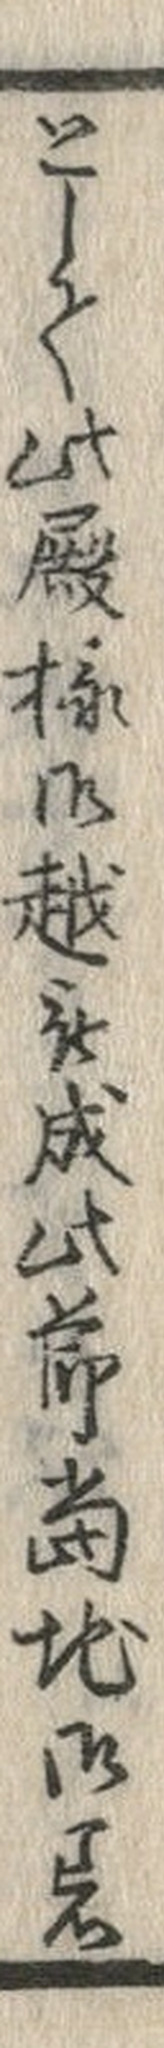として此殿様御越被成此節当地御着
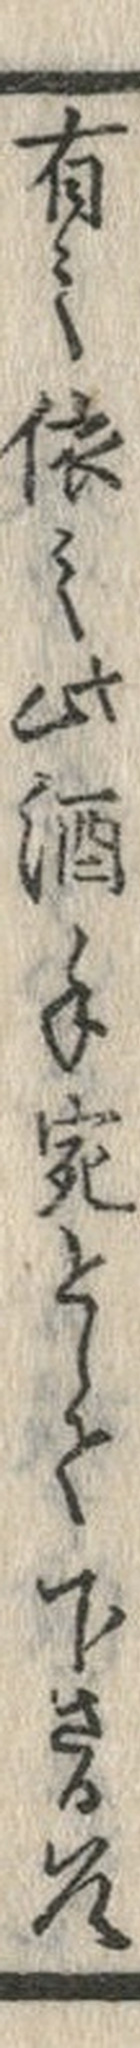有之依之此酒手宛として下さる乍
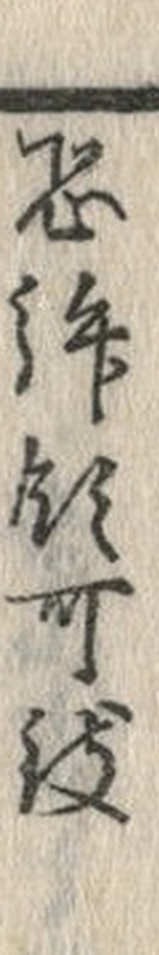恐拝領可致
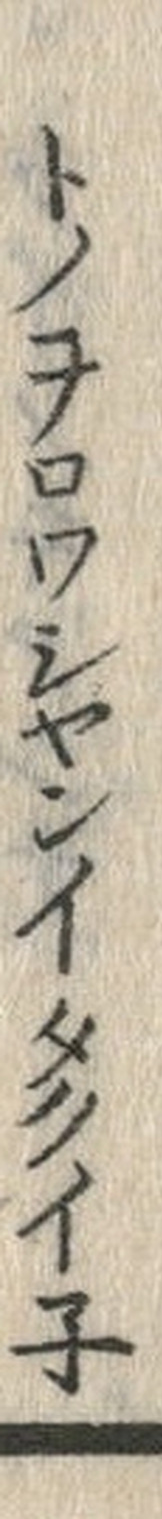トノヲロワシヤンイタクイネ
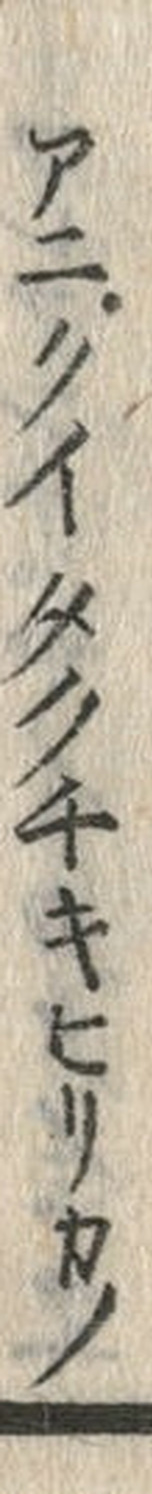アニ。クイタクチキヒリカノ
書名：蝦夷方言藻汐草　坤巻
